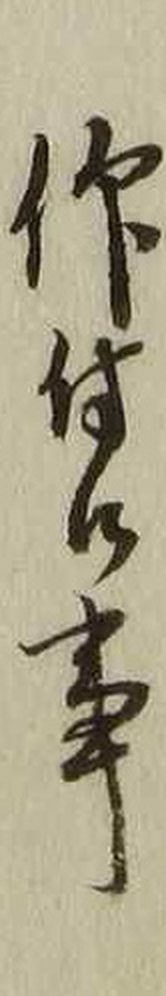仰付候事
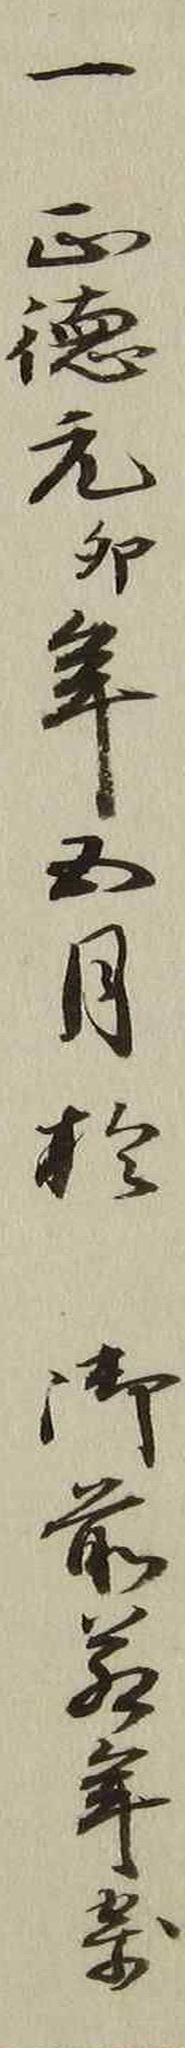一正徳元卯年五月於御前若年寄
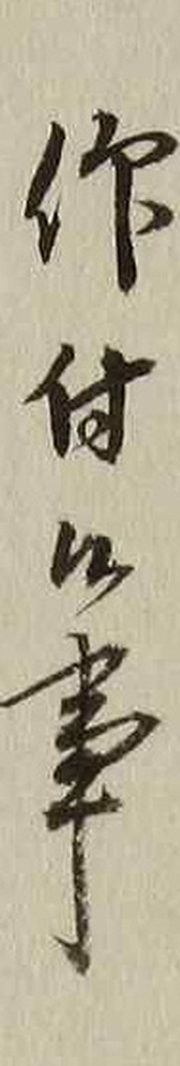仰付候事
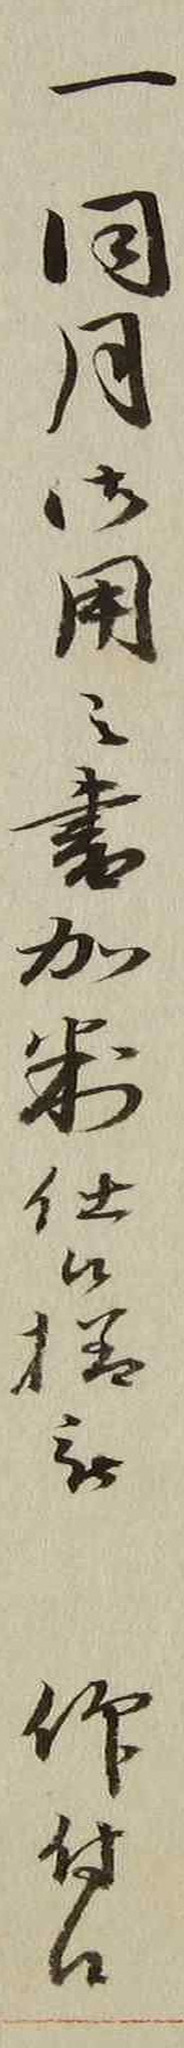一同月御用之書加判仕候様被仰付候
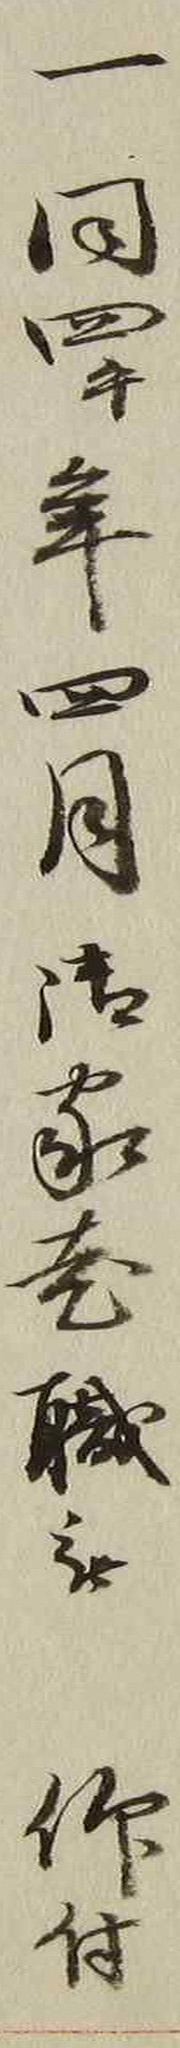一同四午年四月御家老職被仰付
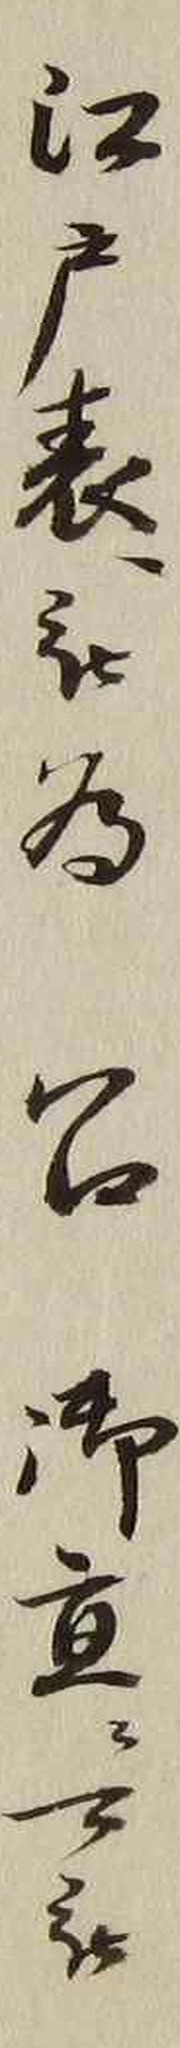江戸表へ被為召御立に可被
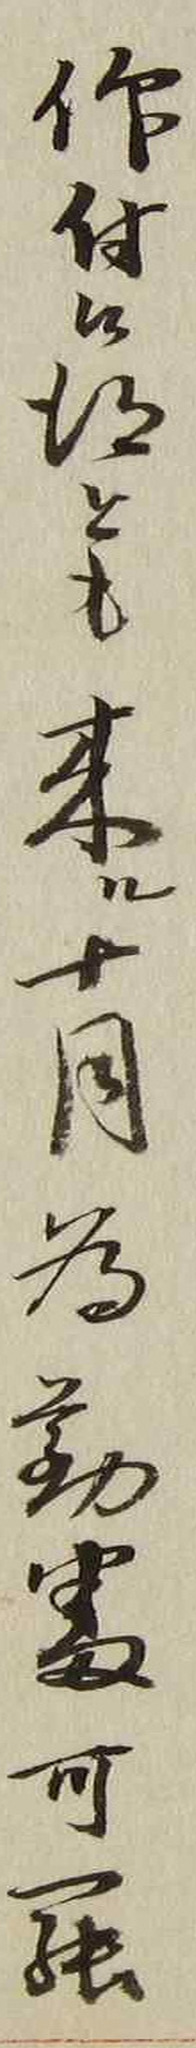仰付候得とも来る十月為勤番可罷
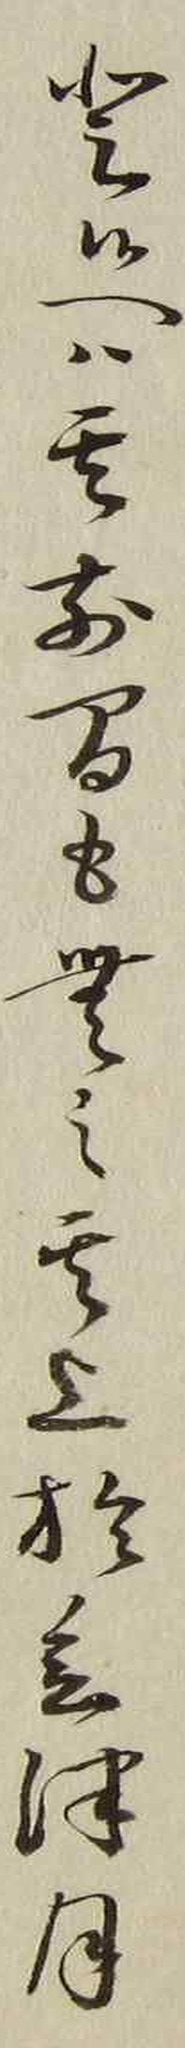登候へは其前間も無之其上於会津月
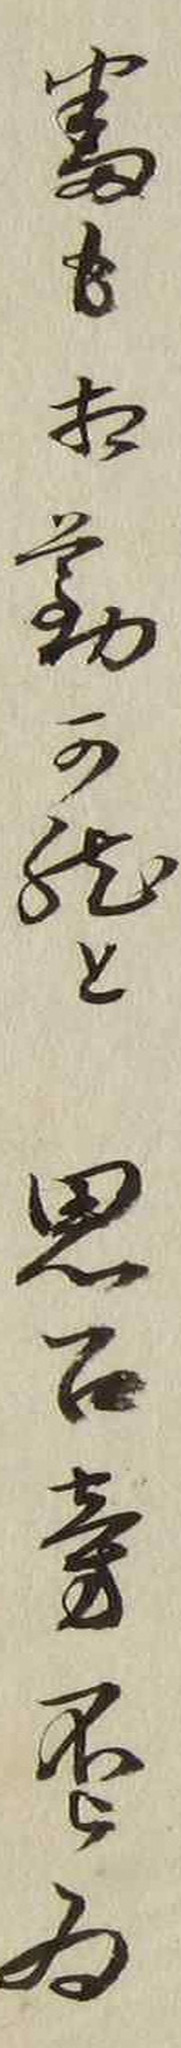番も相勤可然と思召旁不被為
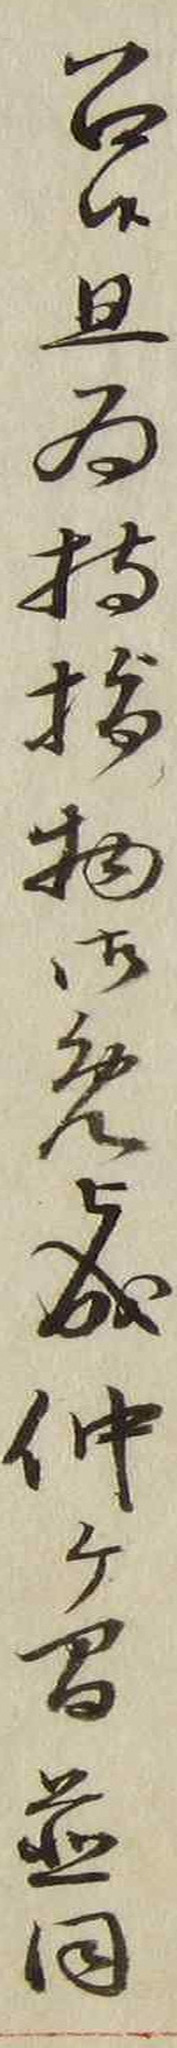召候且為持指物御免被成仲け間並同
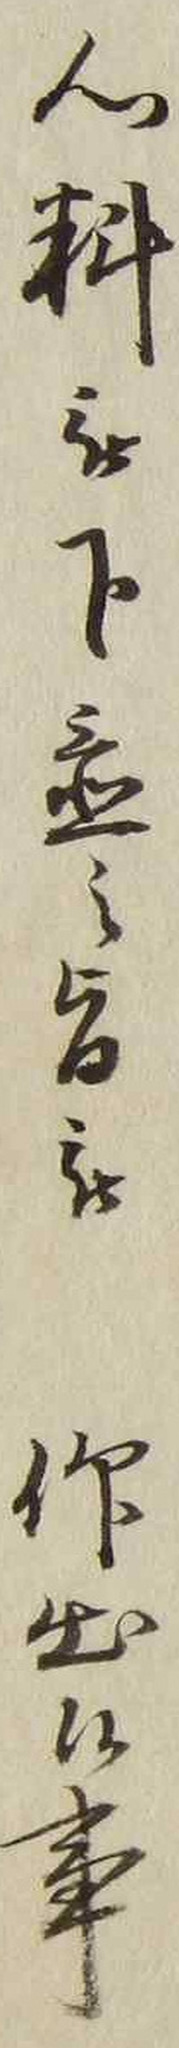心料被下置之旨被仰出候事
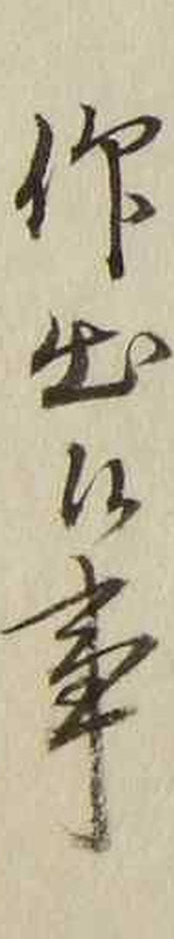仰付候事

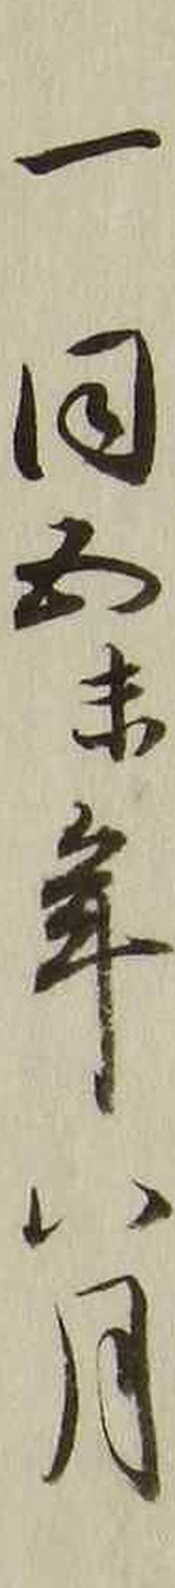一同五末年八月
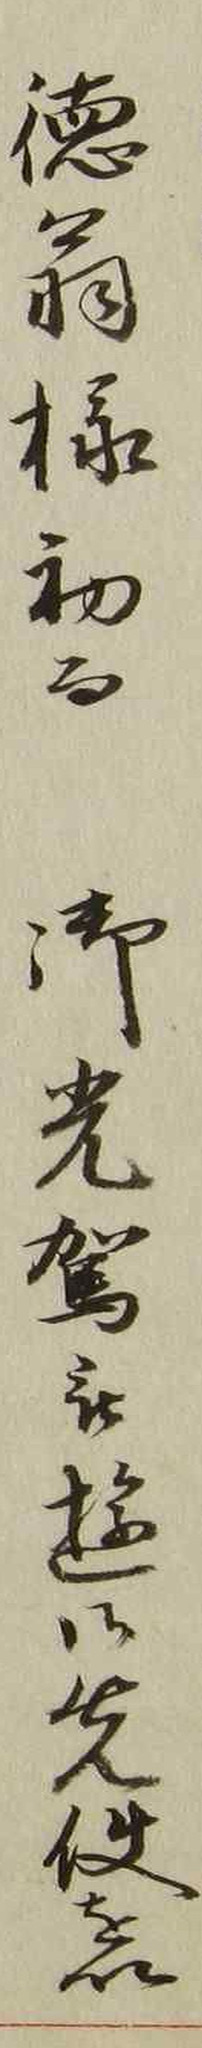徳翁様初而御光駕被遊御先使を以
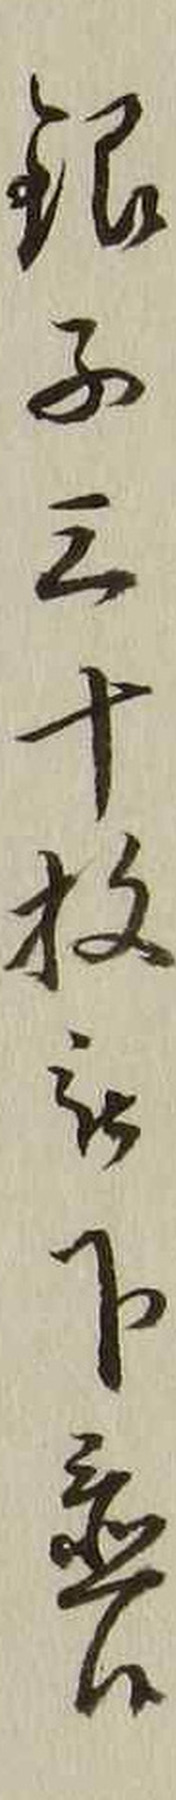銀子三十枚被下置候
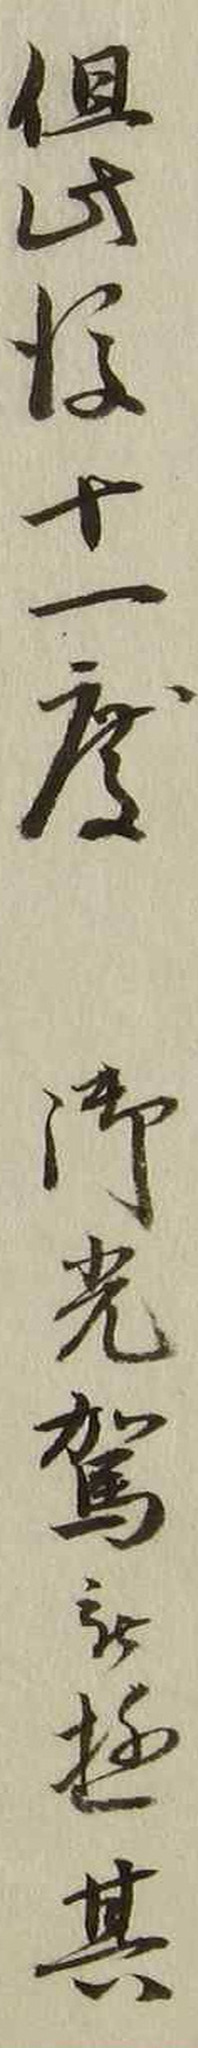但此後十一度御光駕被遊其
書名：諸士系譜　巻之125　た之部1
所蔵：会津若松市立会津図書館
